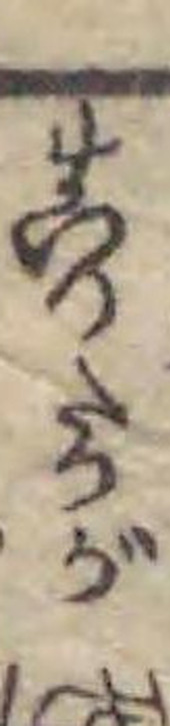まいりたかが
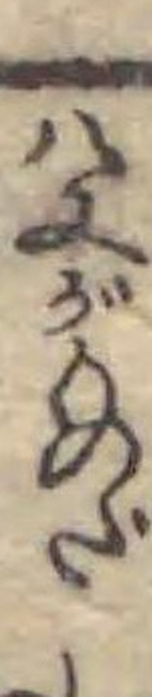八文がものだ
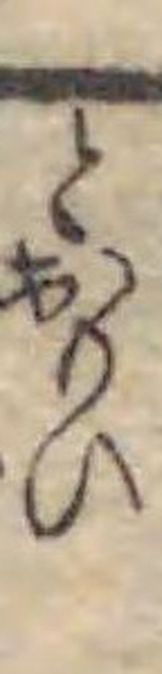とおもひ
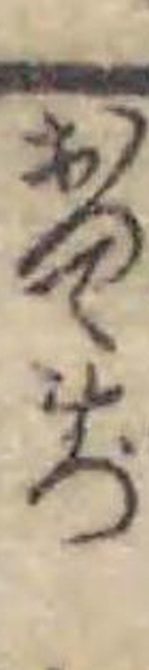おつてまづ
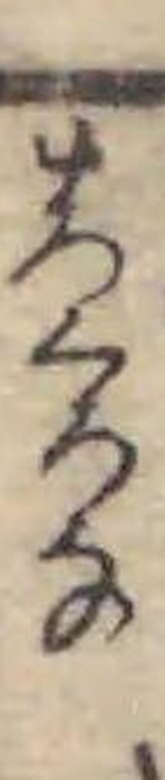まつくろな
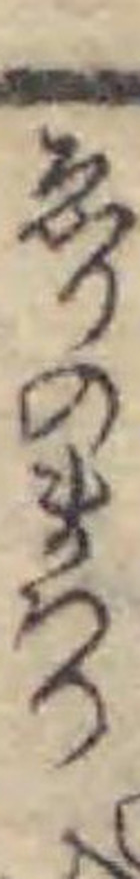ゑりのまわり
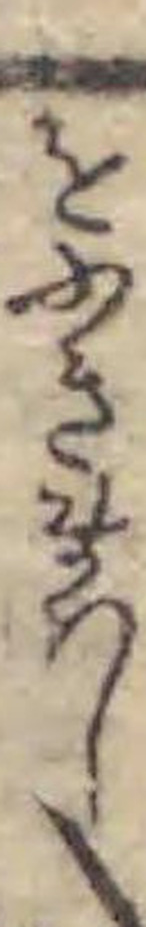をふきまわし
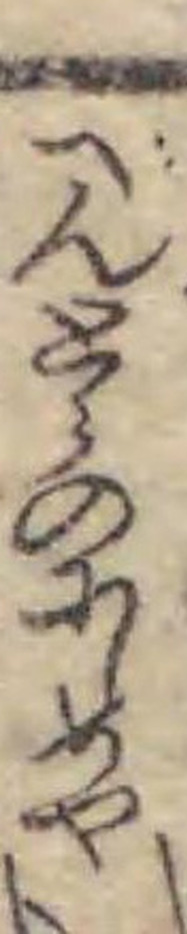べんとうのにしめや
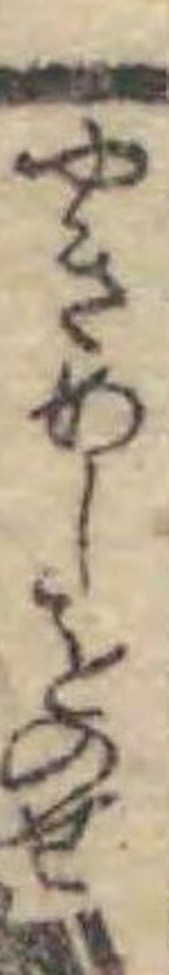やきめしをのせ
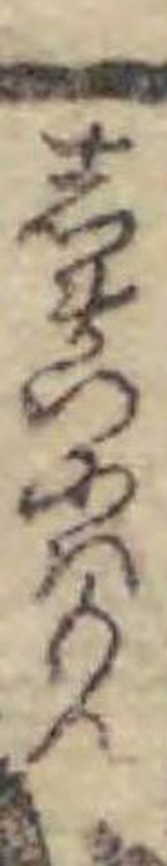しまいにはもん
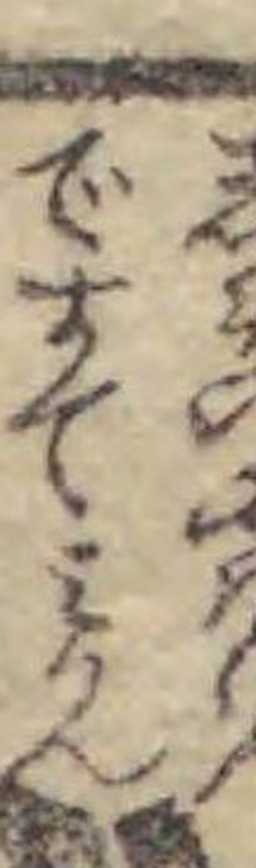ですてみかん
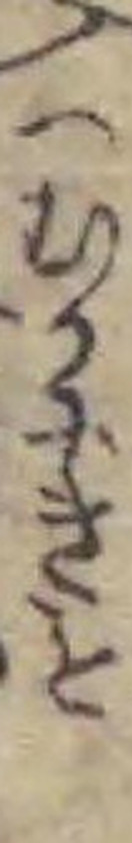つむりにきを
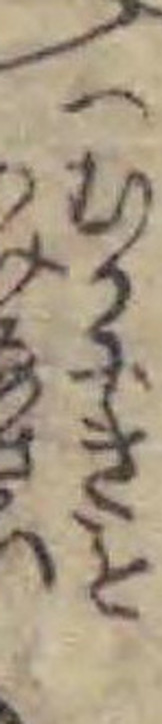つけなさい
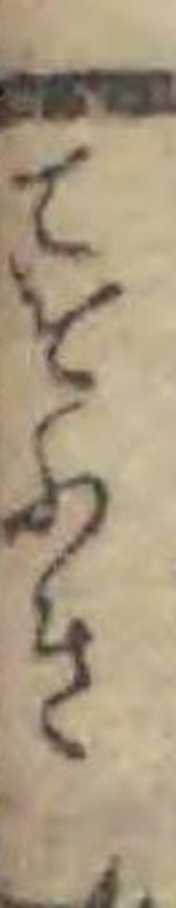てをふき

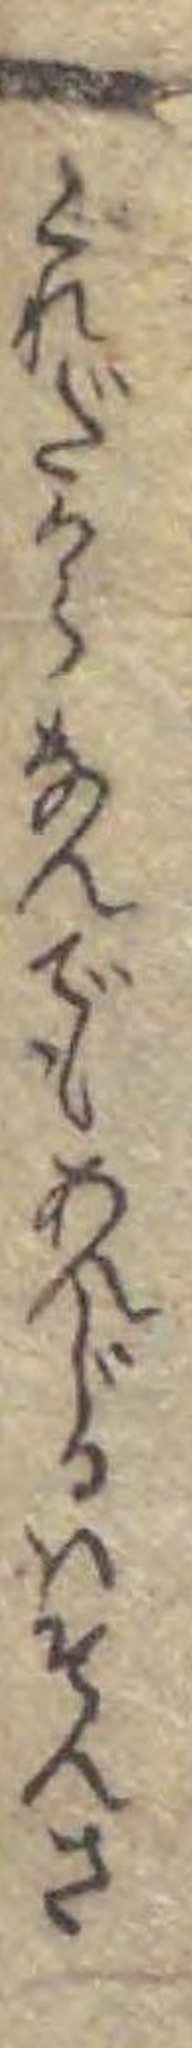これだからなんでもあんじるはそんさ清長画
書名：紙屑身上噺 : 3巻
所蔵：国立国会図書館 National Diet Library, JAPAN
